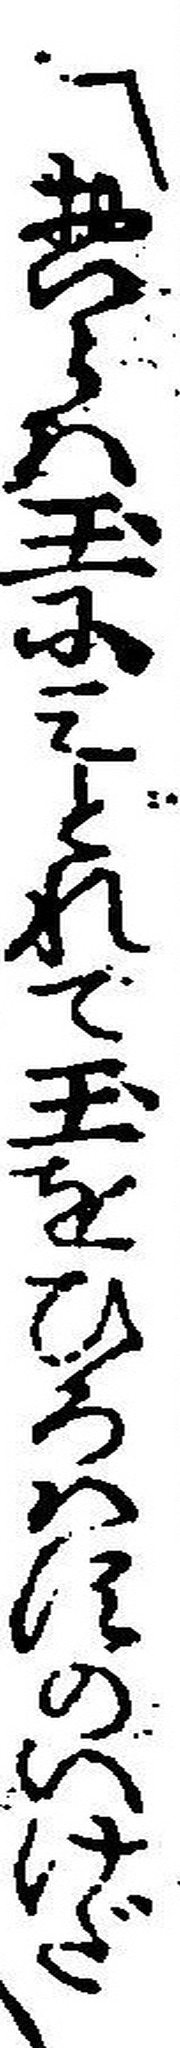〽おいらは玉にみとれて玉をひろはすのいけだ
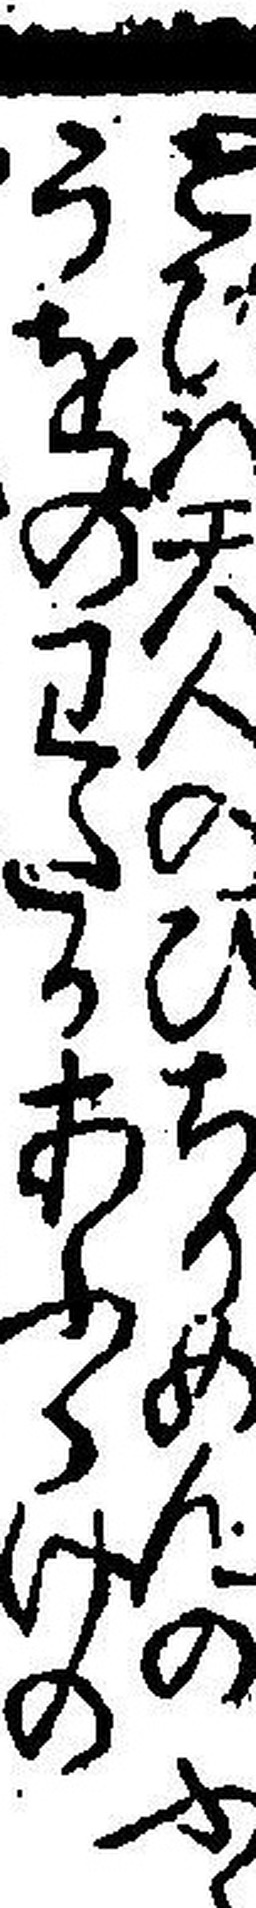うをのわたかあふらけの
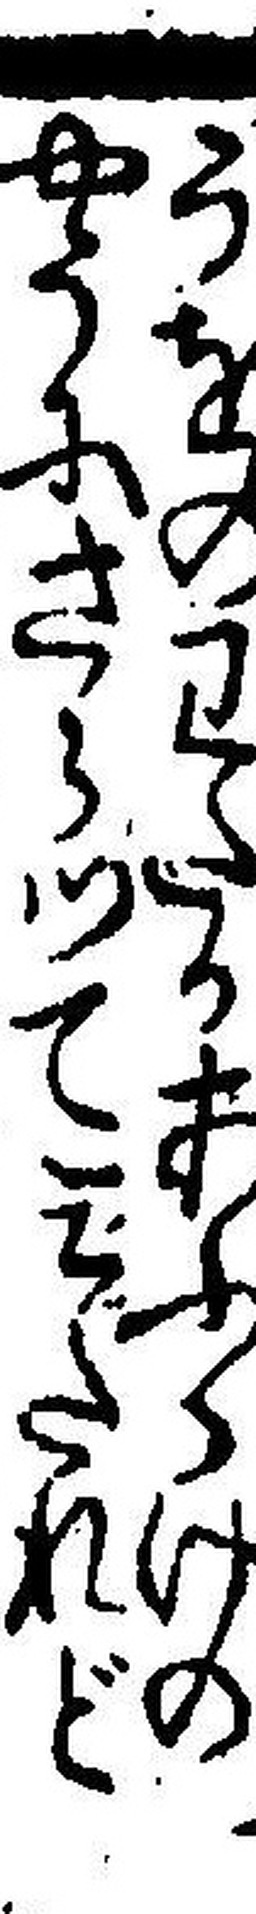やふにさらつてみたれど
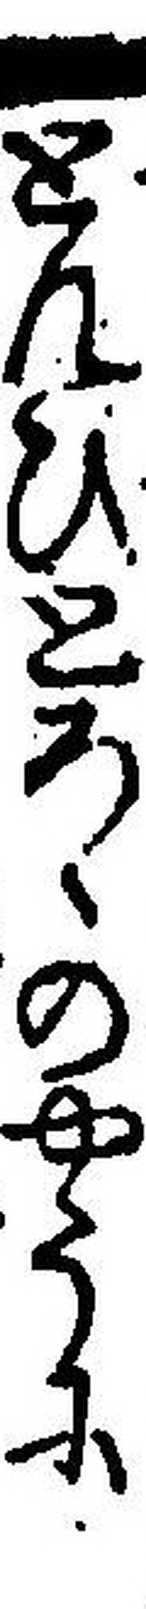とんひとろゝのやうに
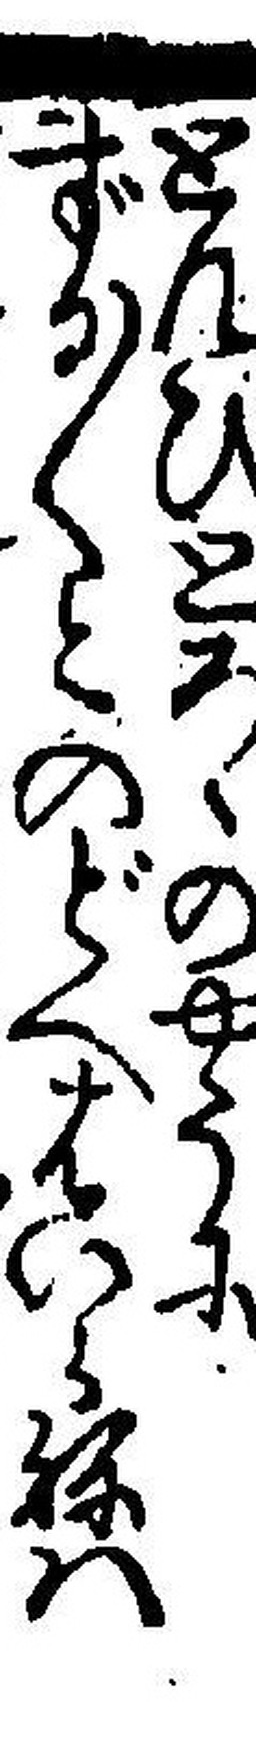ずる〳〵とのどへはいらねは
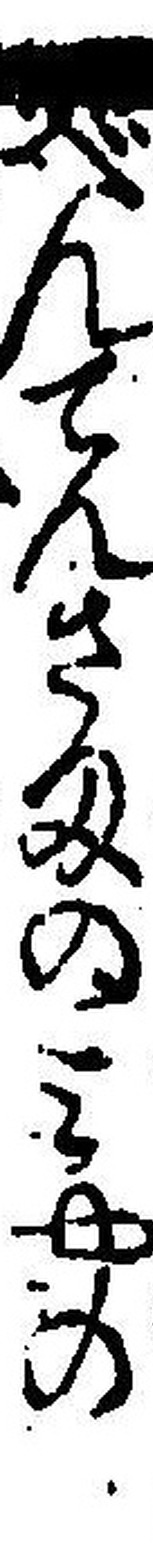べんてんさまのみやの
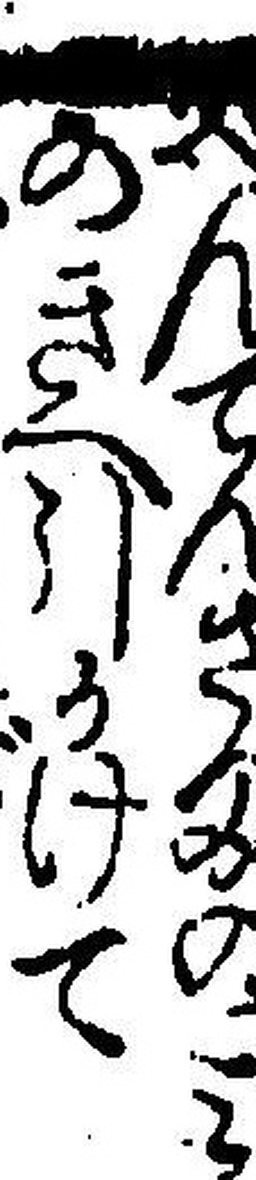のきへ引かけて
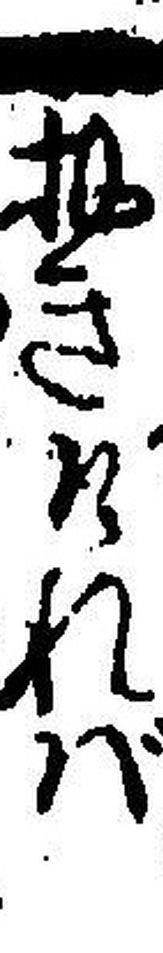おきければ
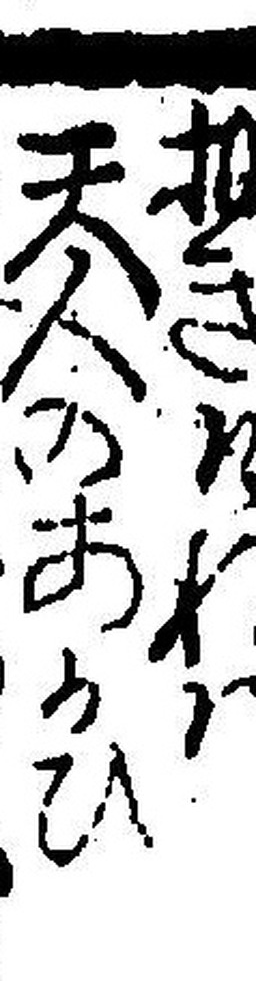天人のあかひ
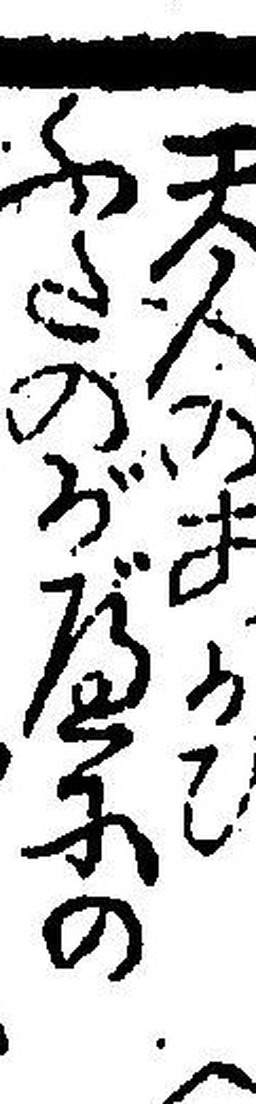ふたのがべにの
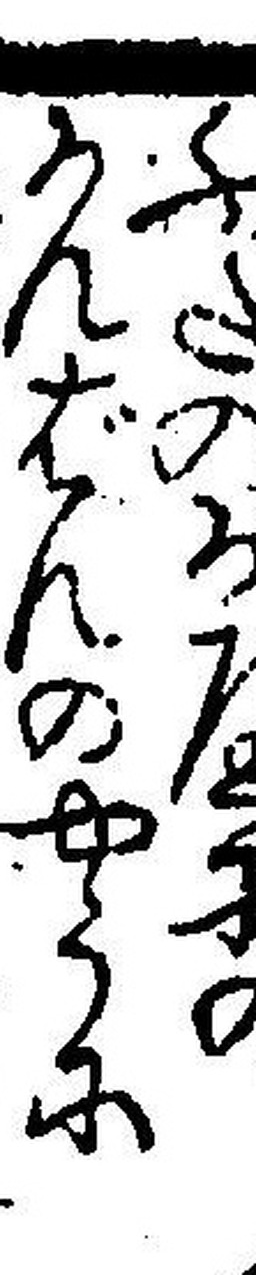かんばんのやうに
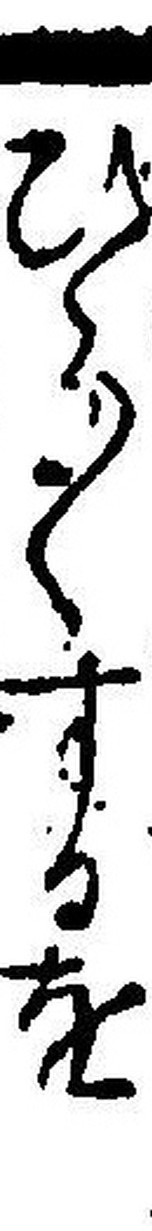ひら〳〵するを
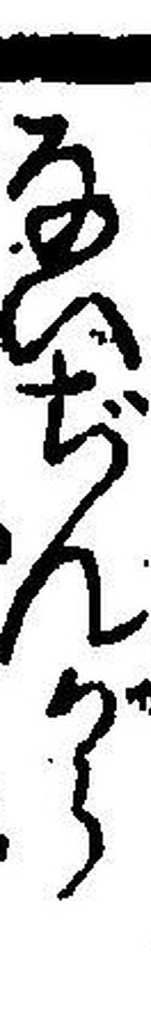ないぢんから
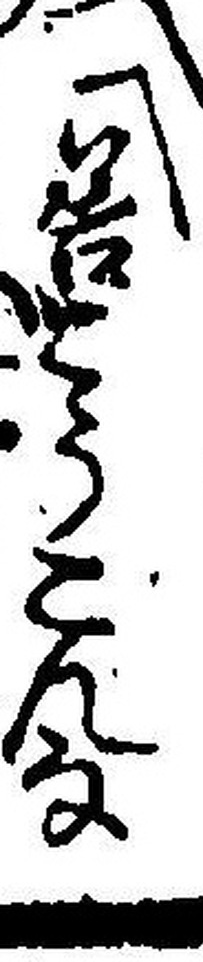〽善こうこんな
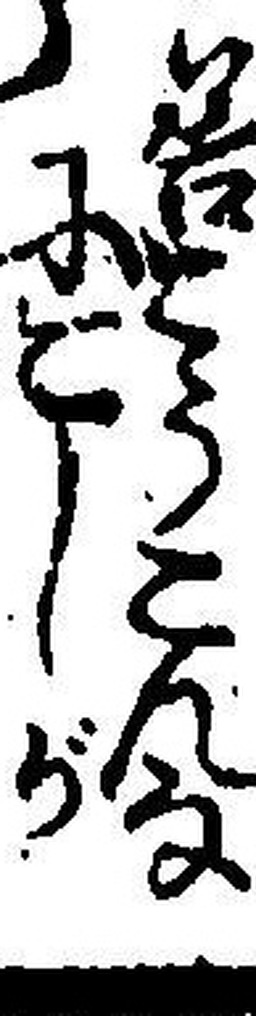にこしが
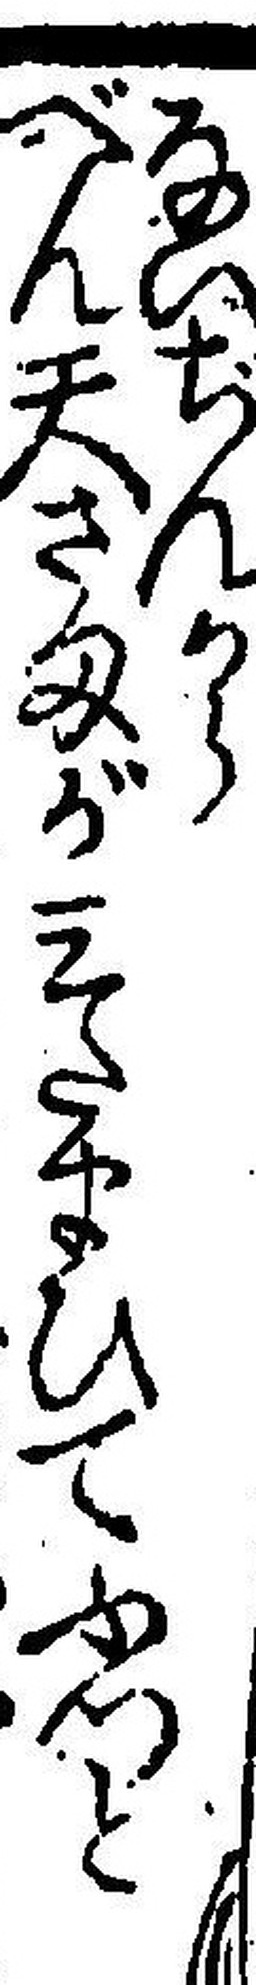べん天さまがみたまひてふつと
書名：徳若水縁起金性 / 樹下石上作
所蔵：東京大学総合図書館 General Library in the University of Tokyo, JAPAN
